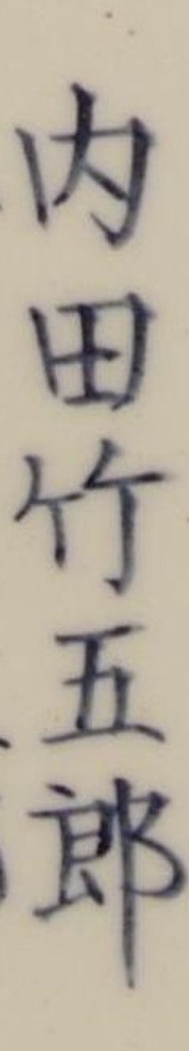内田竹五郎
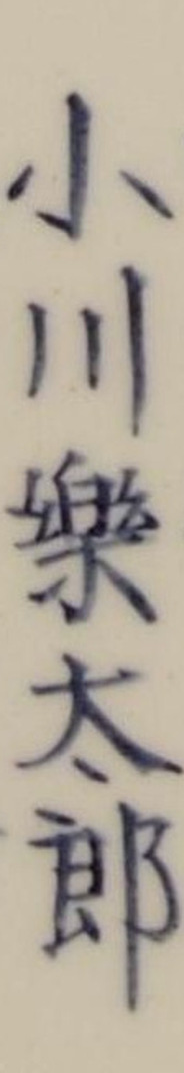小川楽太郎
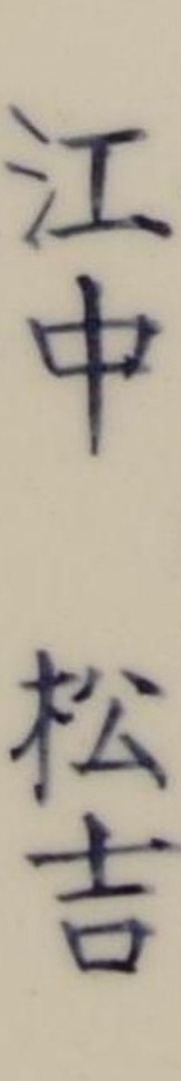江中松吉
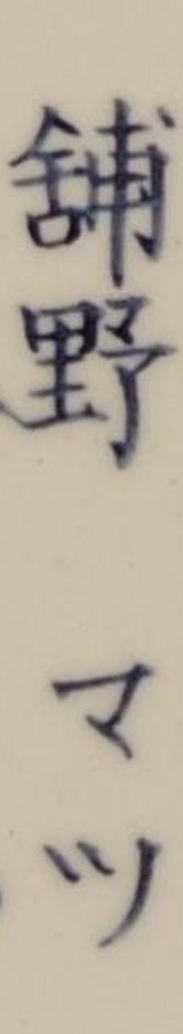舗野マツ
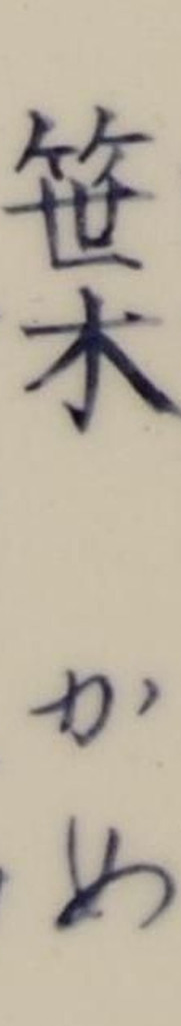笹木かめ
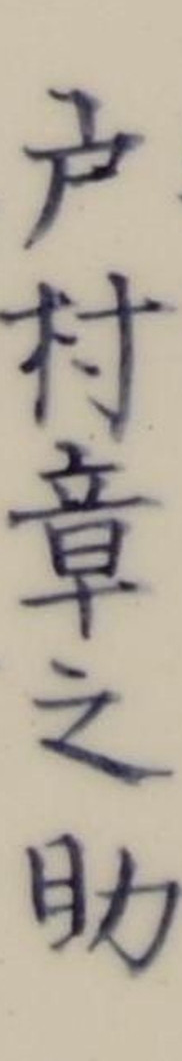戸村章之助
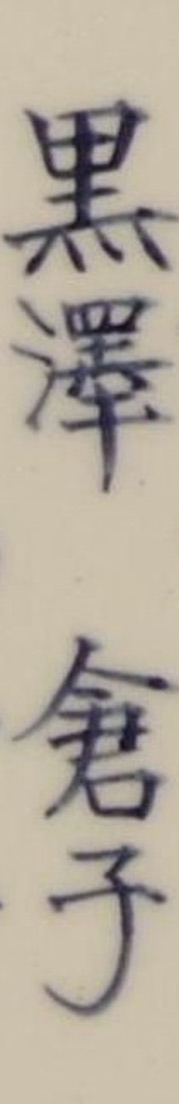黒澤倉子
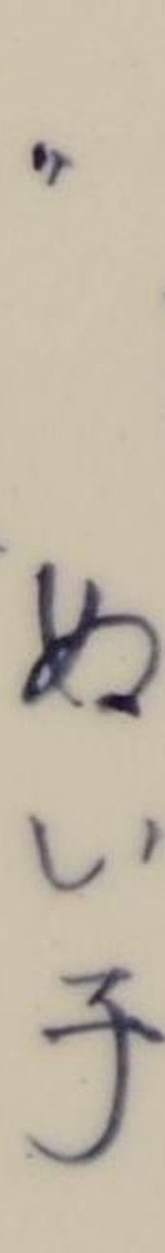ぬい子
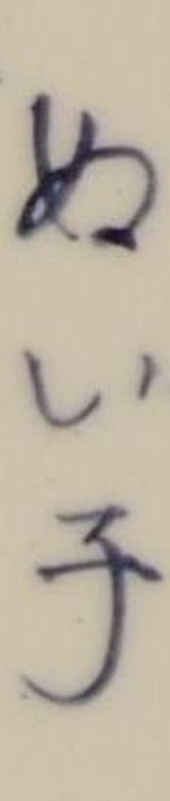ぬい子
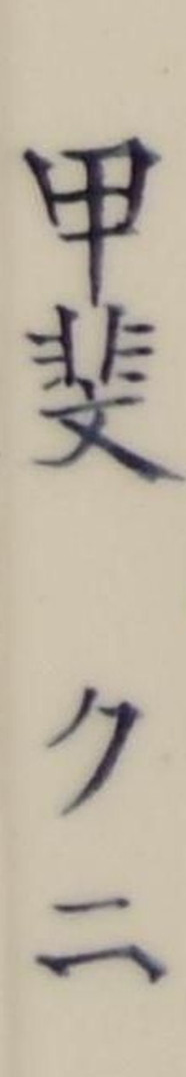甲斐ク二

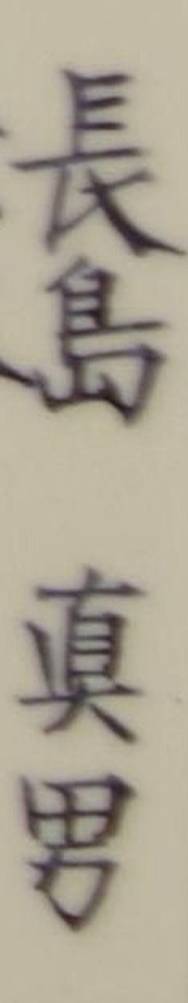長島真男
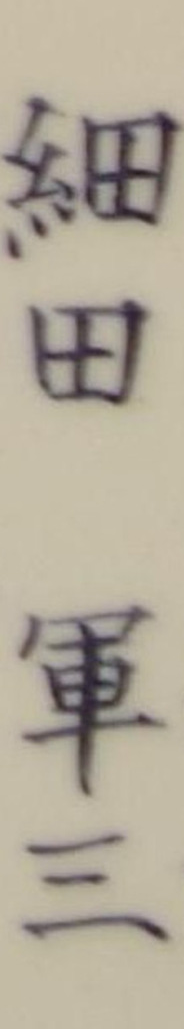細田軍三
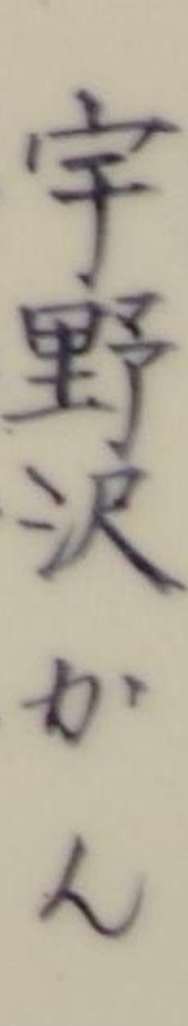宇野沢かん
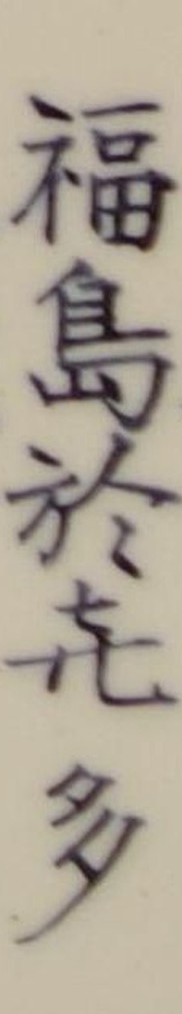福島於喜多
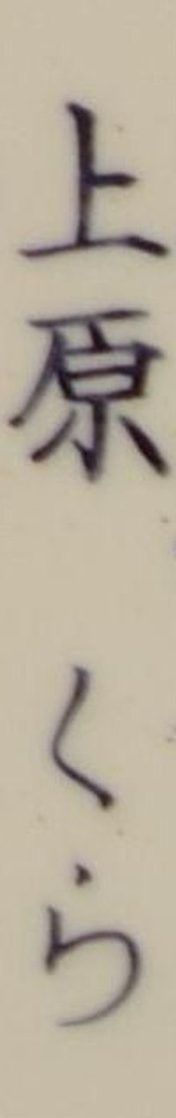上原くら
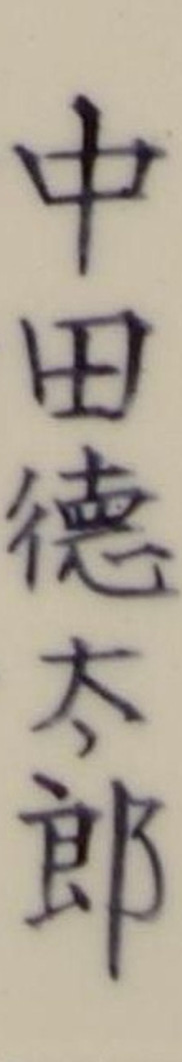中田徳太郎
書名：M~S
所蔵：高野山金剛峯寺
